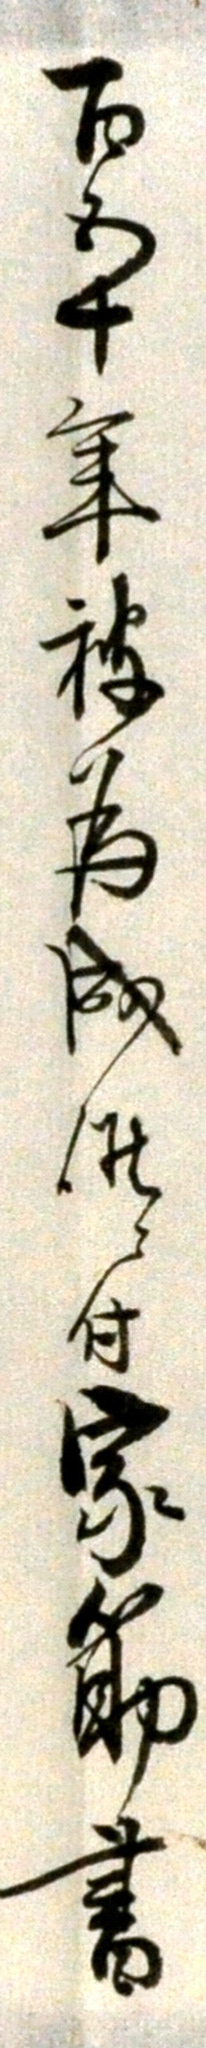百五十年被告為成候ニ付家筋書
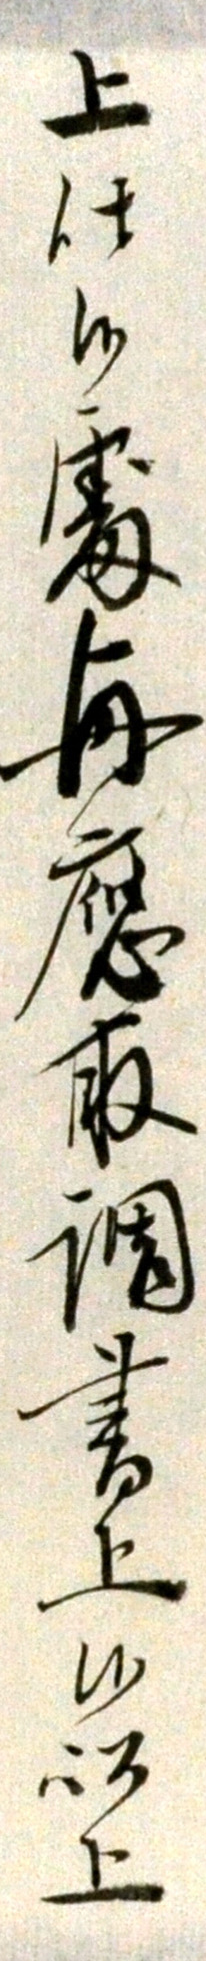上仕候処再応取調書上候以上
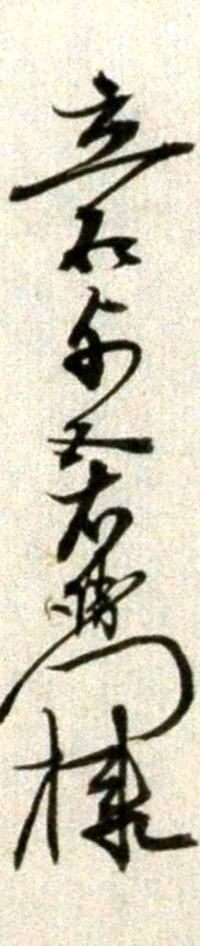立石与五右衛門様
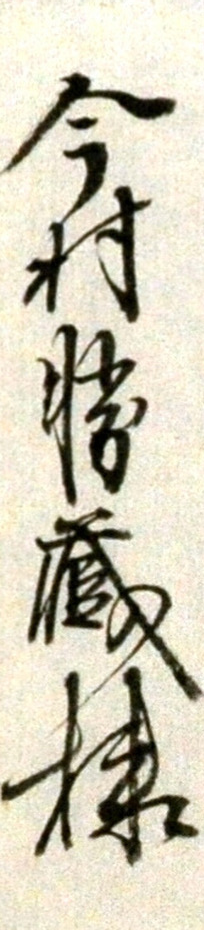今村勝蔵様
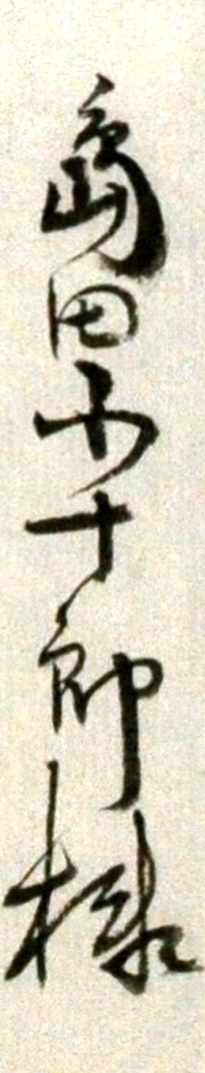島田小十郎様
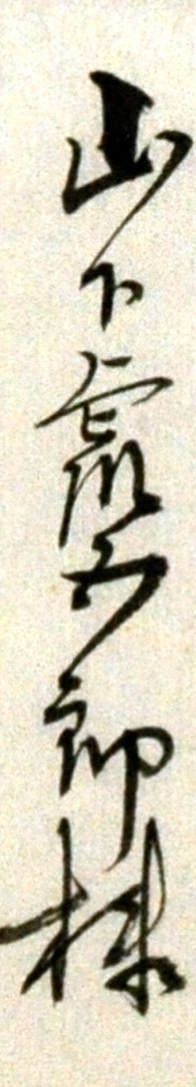山下虎五郎様
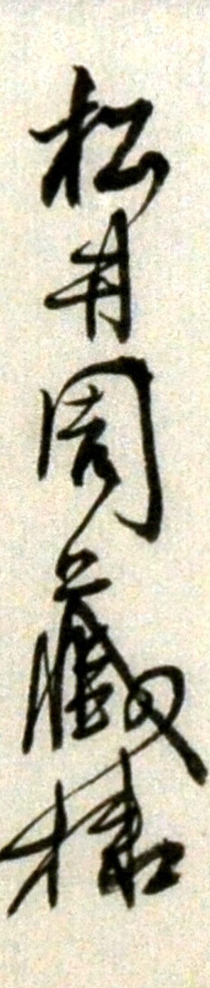松井周蔵様

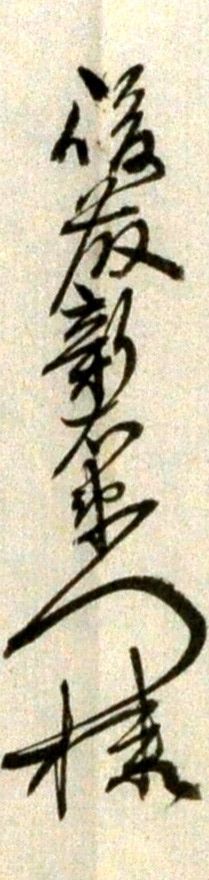後藤新右衛門様
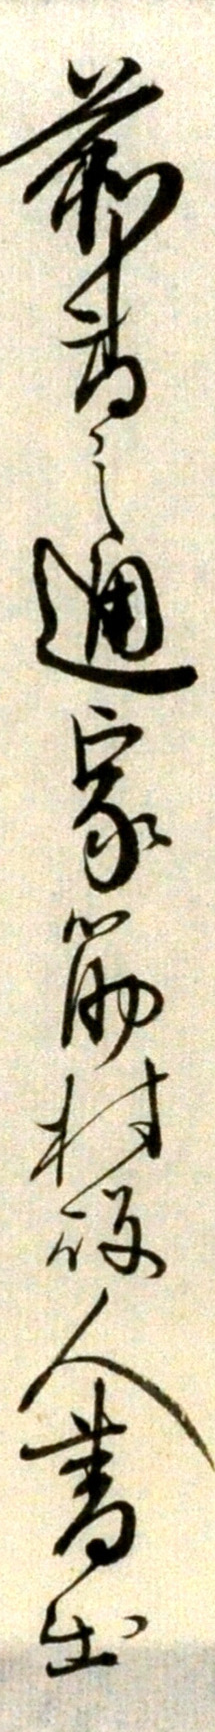前書之通家筋村役人書出
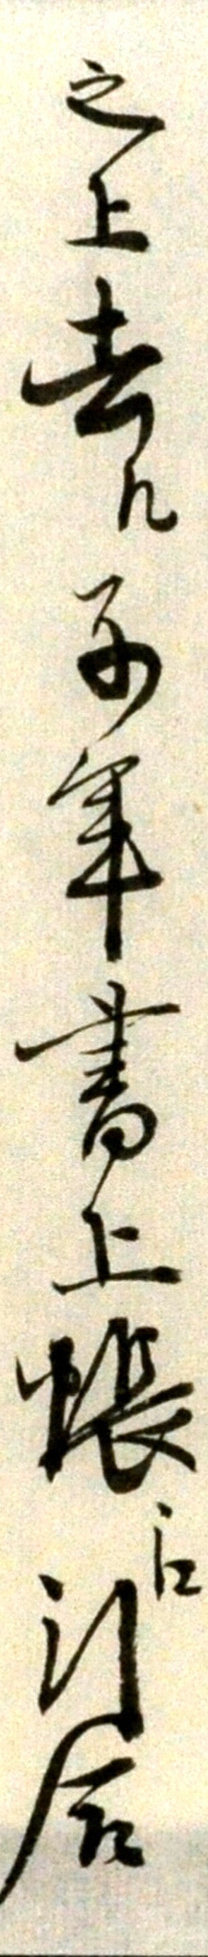之上去ル子年書上帳江引合
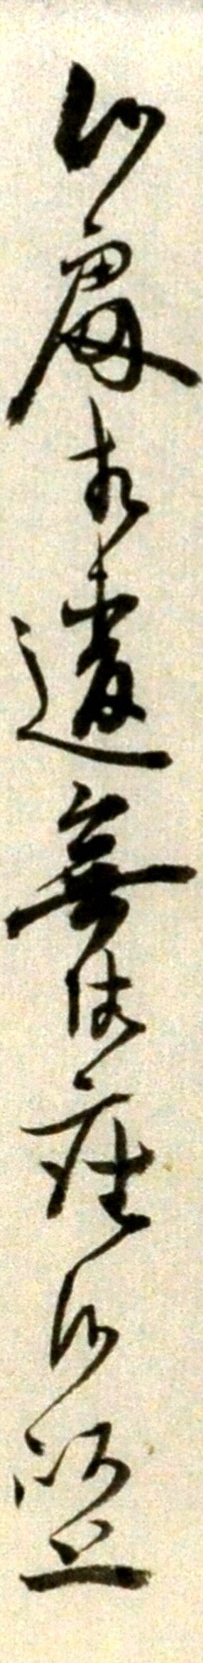候処相違無御座候以上
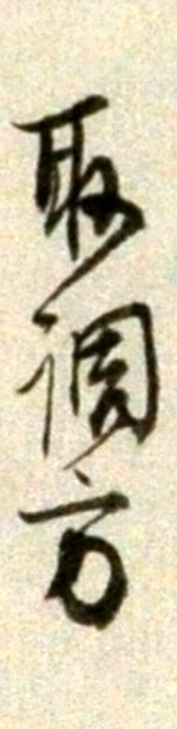取調方
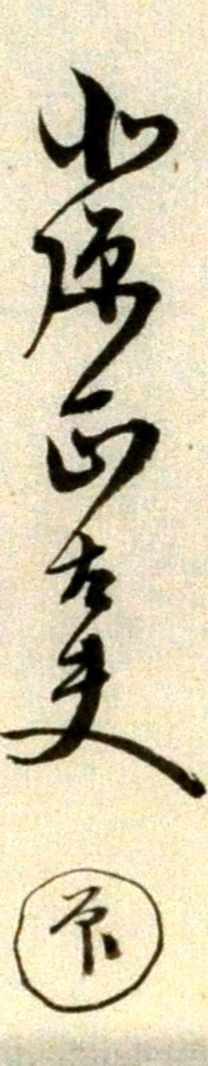北原正太夫印
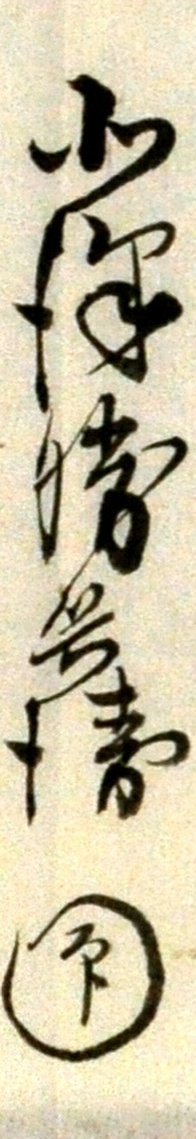北澤清兵衛印
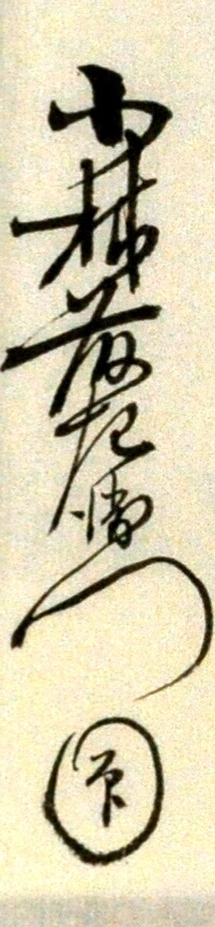小林藤左衛門印
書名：小松家古系図写・一通、浦村家筋帳抜粋・一通
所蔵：伊那市立高遠町図書館・合同会社AMANE
